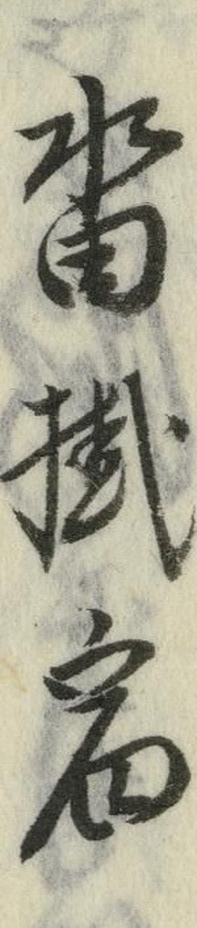沓掛宿
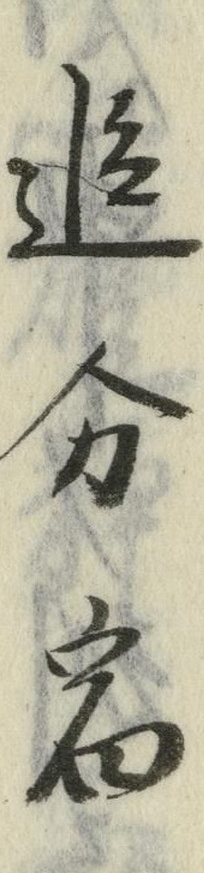追分宿
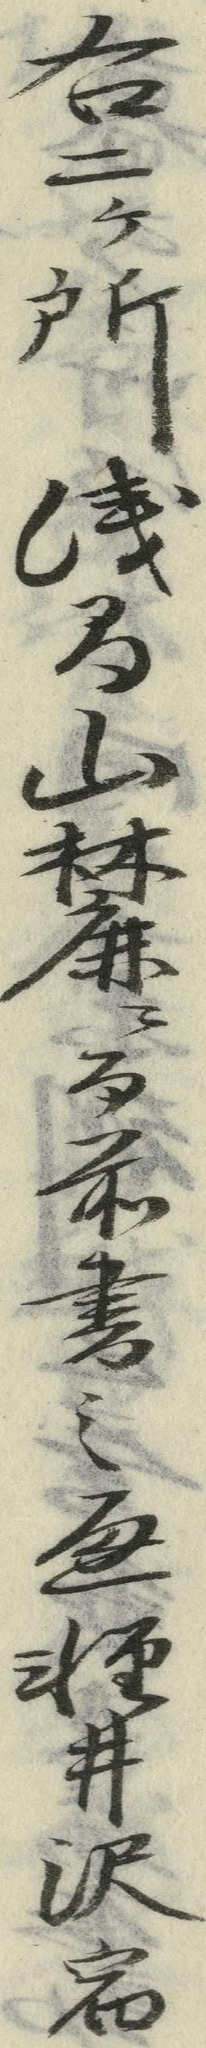右二ヶ所浅間山麓ニ而前書之通軽井沢宿
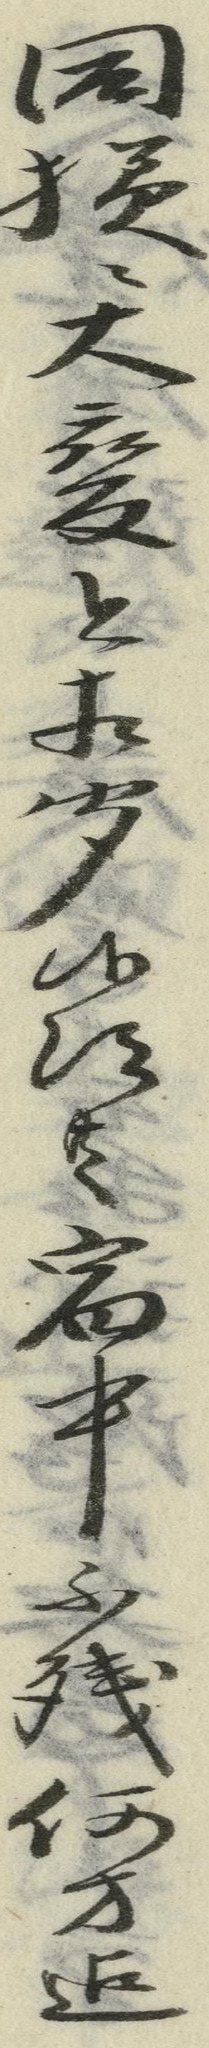同様大変と相聞候得共宿中不残何方迄
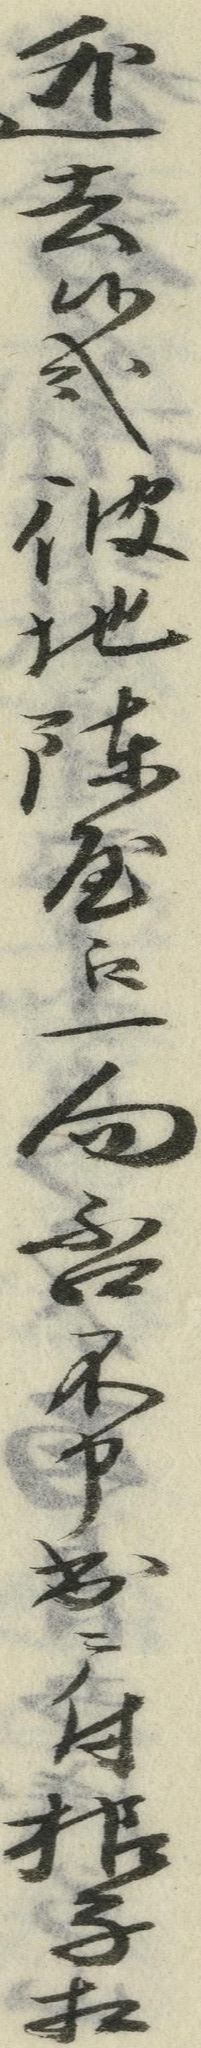逃去候哉彼地陣屋江一向否不申出ニ付様子相
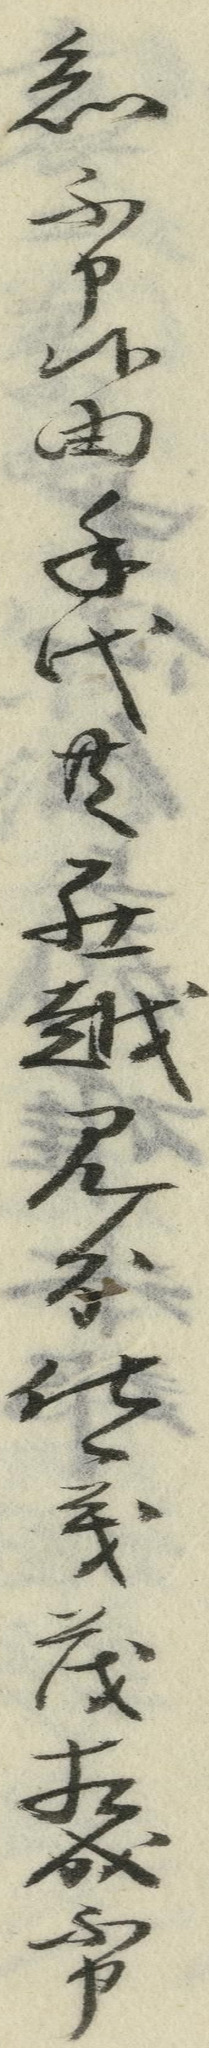知不申候由手代共罷越見分仕候義茂相成不申
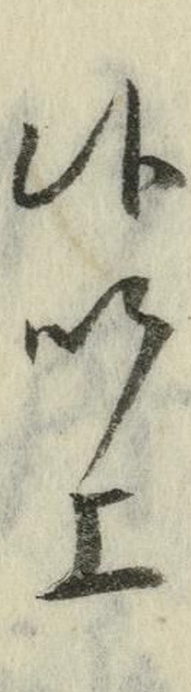候以上

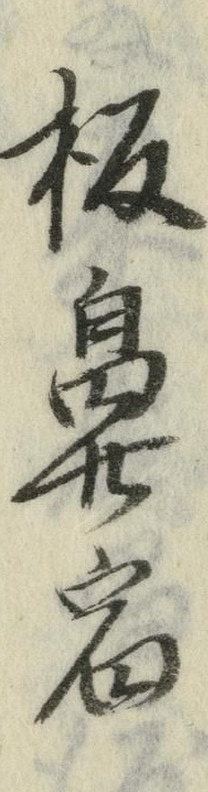板鼻宿
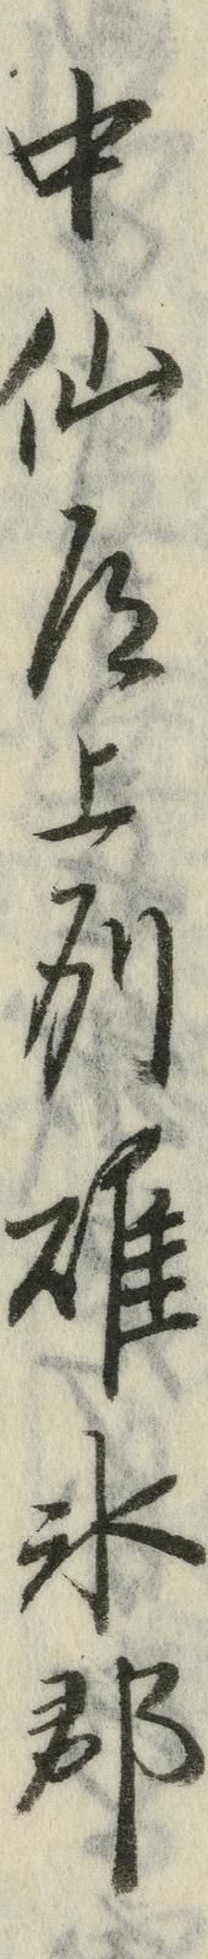中仙道上州碓氷郡
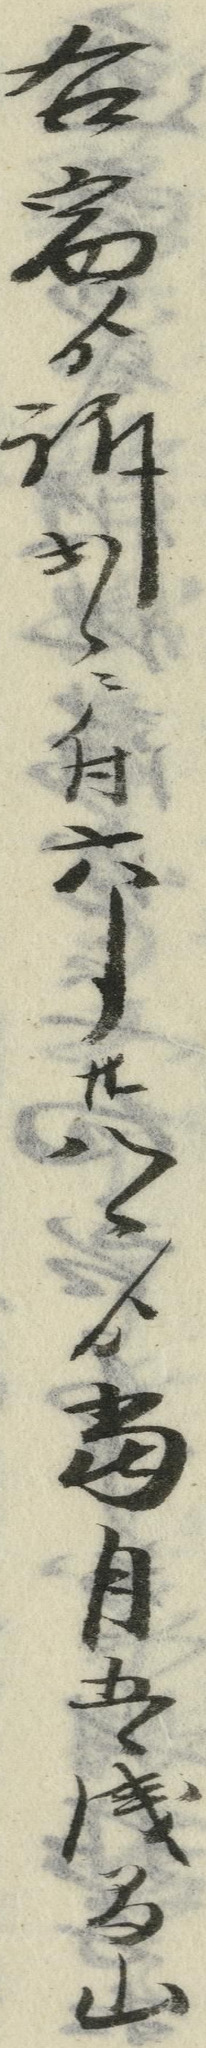右宿ゟ訴出候ニ付六月廿八日ゟ当月五日浅間山
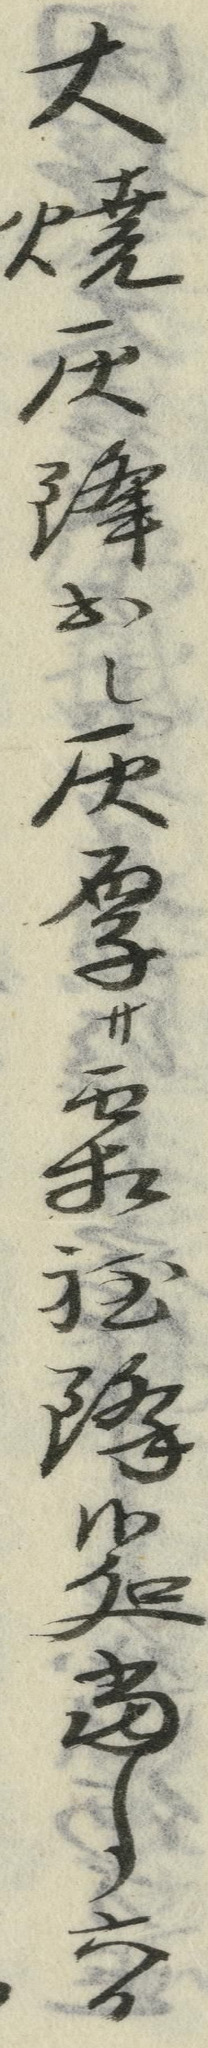大焼灰降出し灰厚サ霜程降候処当月六日
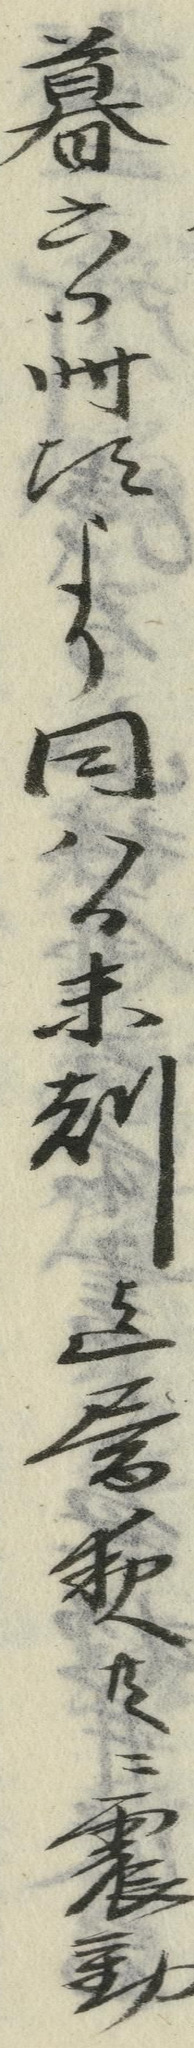暮六ツ時頃より同八日未刻迄昼夜共ニ震動
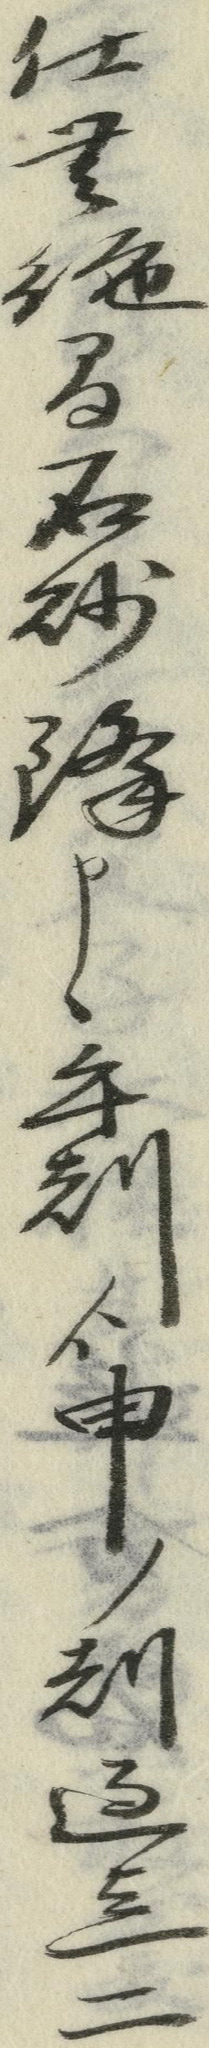仕無絶間石砂降申候午刻ゟ申ノ刻過迄二
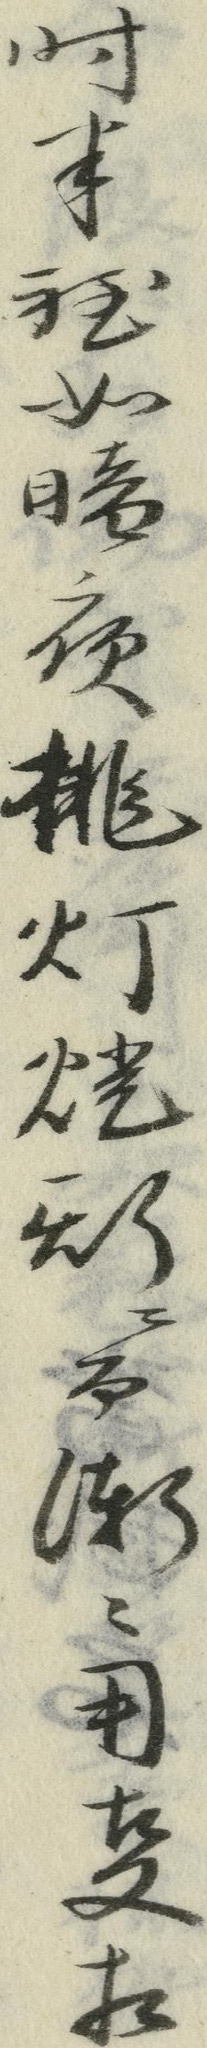時半程如暗夜桃灯燈斯二而漸ニ用事相
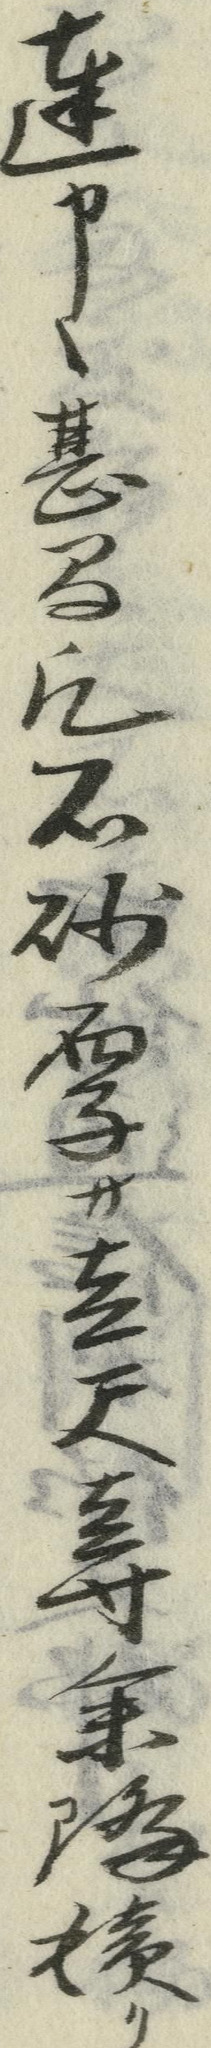達申候甚間凡石砂厚サ壱尺壱寸余降積リ
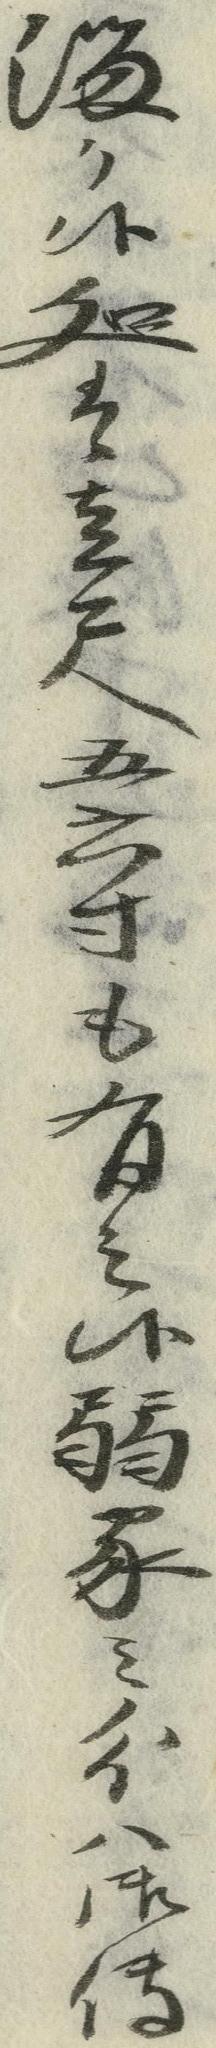溜リ候処は壱尺五六寸も有之候弱家之分は御伝
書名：天明三癸卯七月信州浅間山焼出シ上州山津浪ニ付近國ヨリ御届書并訴書写
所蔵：東京大学地震研究所図書室 Earthquake Research Institute Library, The University of Tokyo, JAPAN
